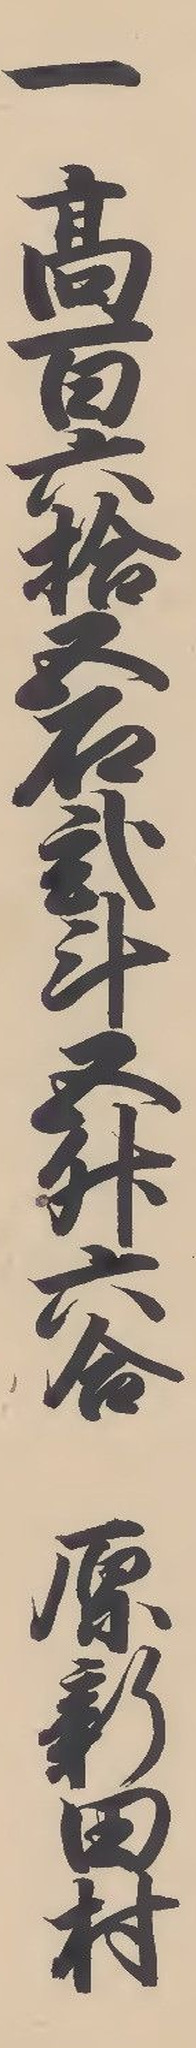一高百六拾五石弐斗五升六合原新田村

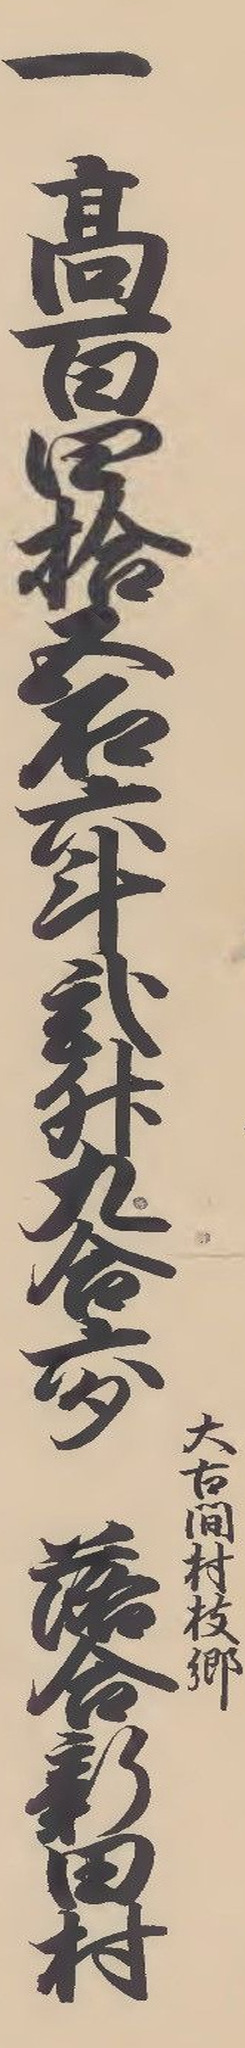一高百四拾五石六斗弐升九合六勺落合新田村
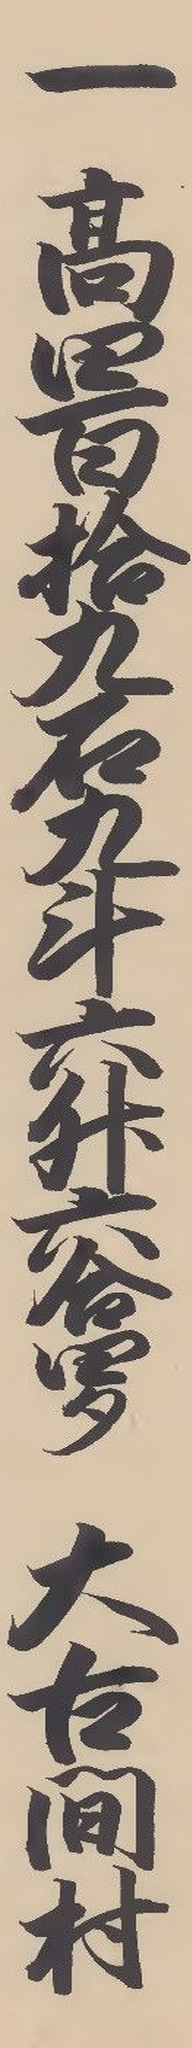一高四百拾九石九斗六升六合四勺大古間村
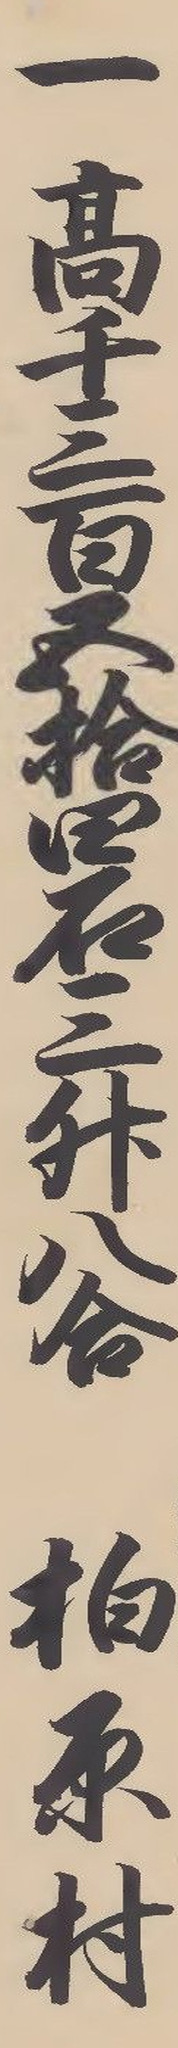一高千三百五拾四石三升八合柏原村
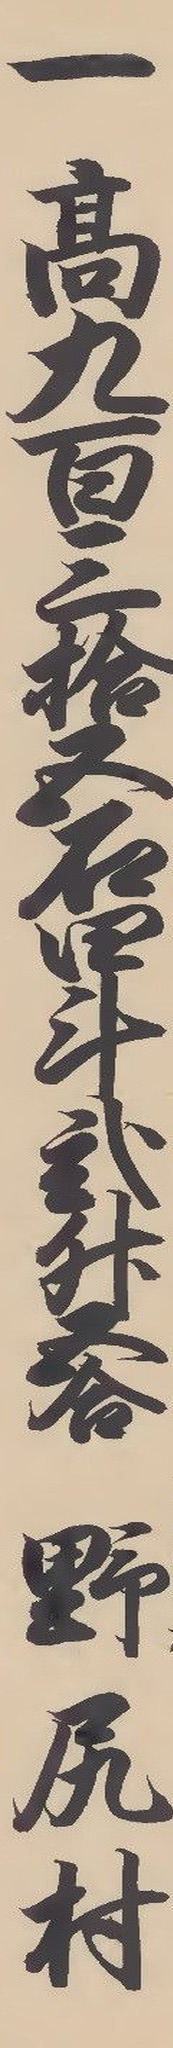一高九百三拾五石四斗弐升五合野尻村
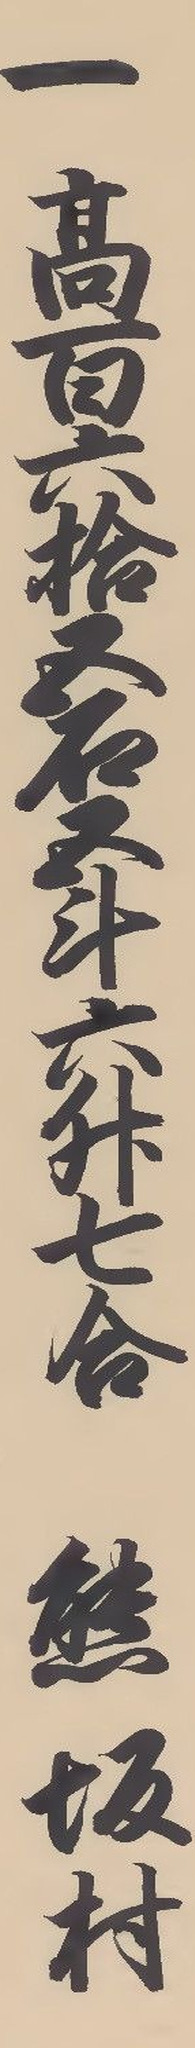一高百六拾五石五斗六升七合熊坂村
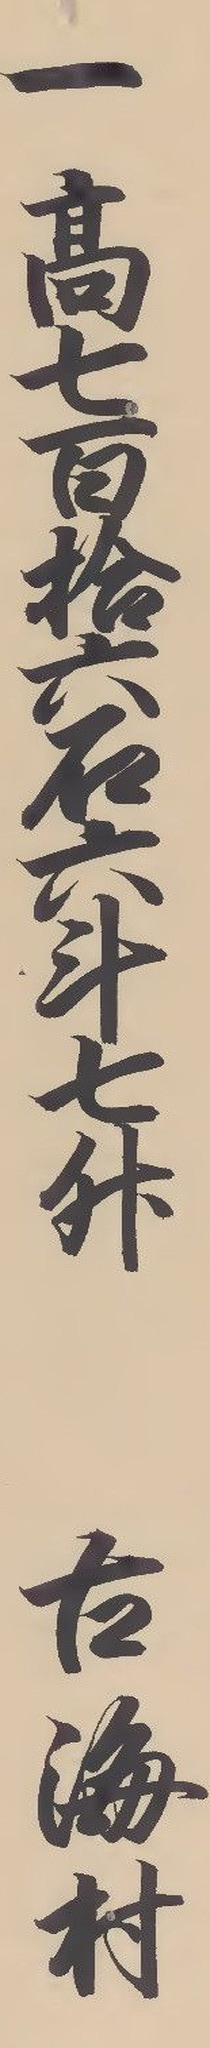一高七百拾六石六斗七升古海村
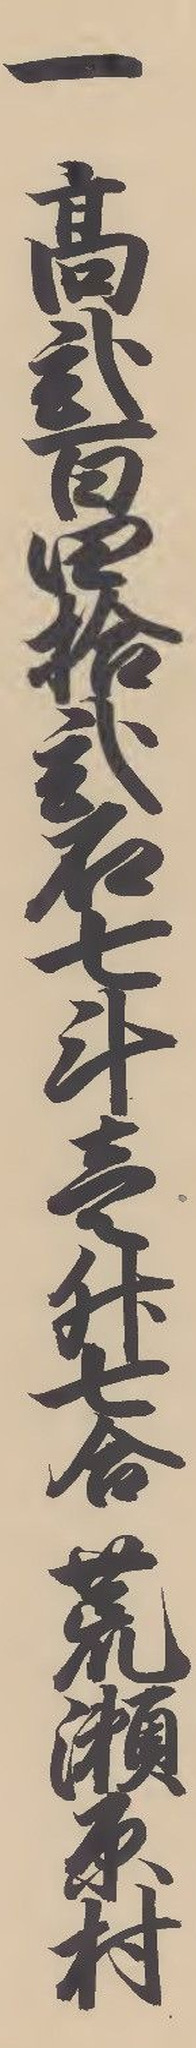一高弐百四拾弐石七斗壱升七合荒瀬原村
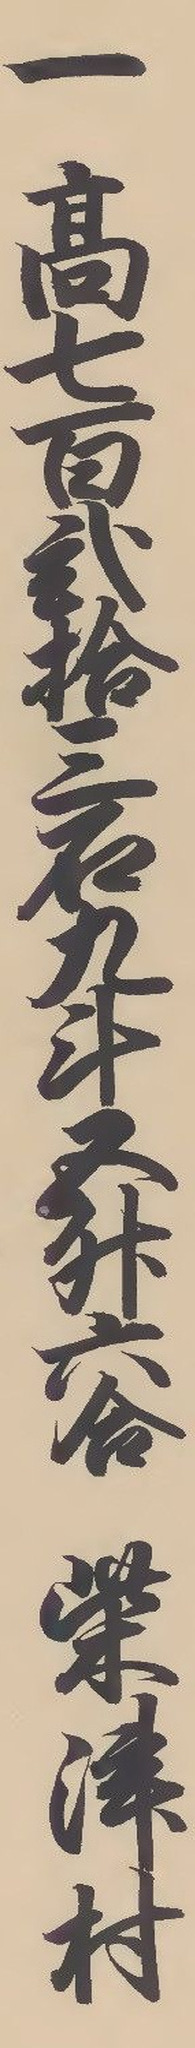一高七百弐拾三石九斗五升六合柴津村

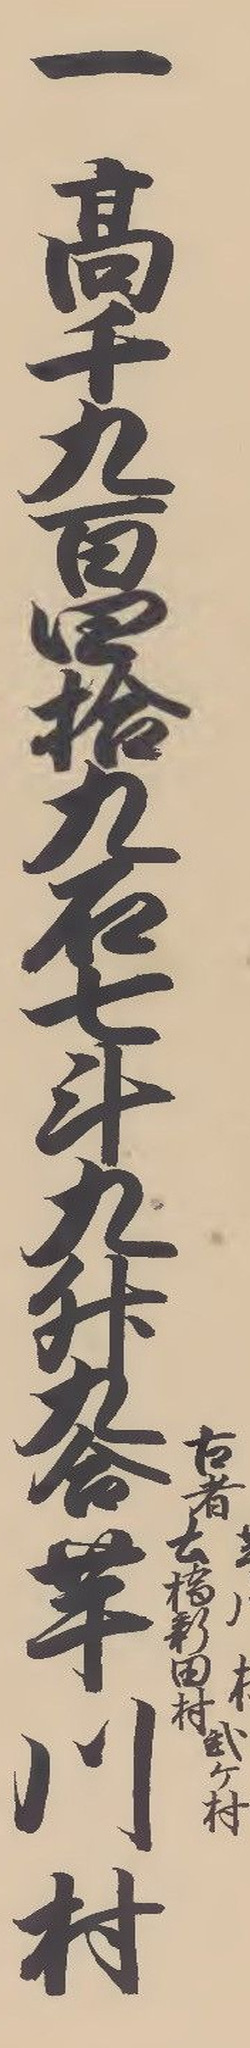一高千九百四拾九石七斗九升九合芋川村
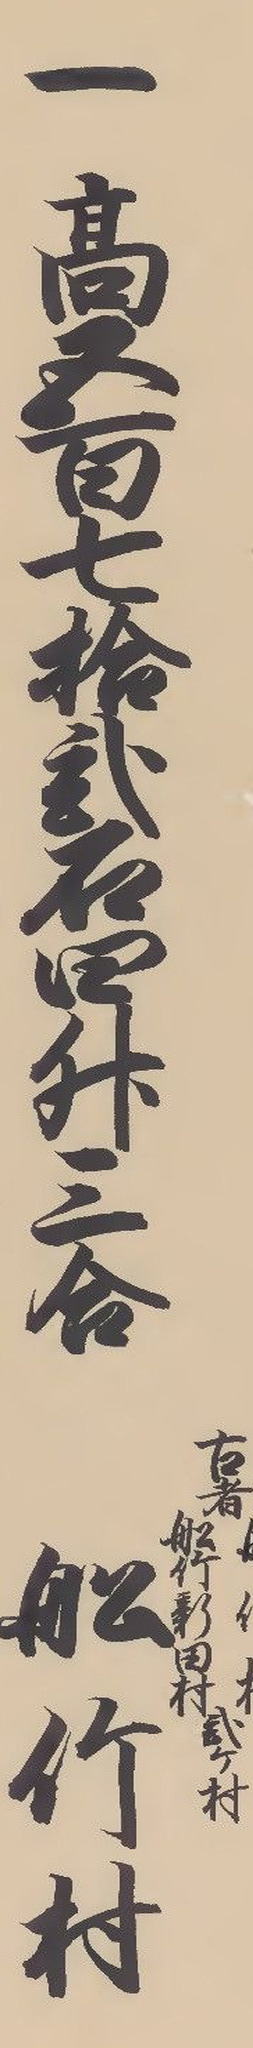一高五百七拾弐石四升三合船竹村
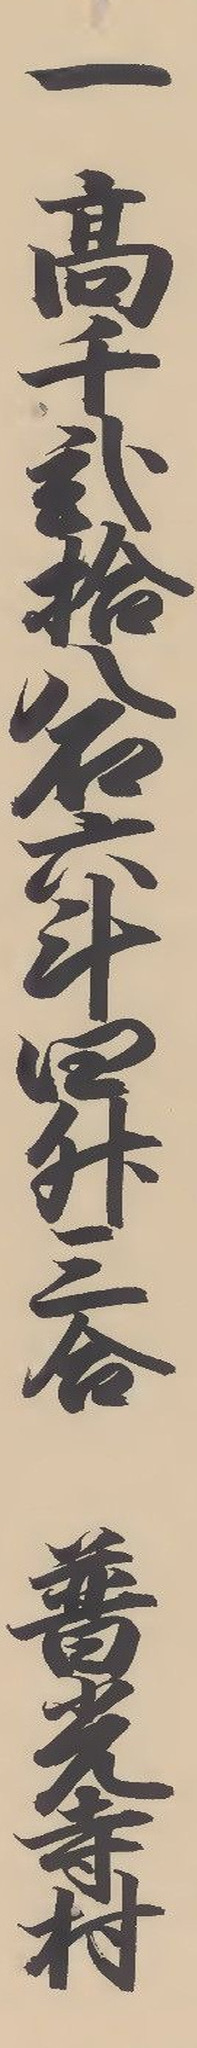一高千弐拾八石六斗四升三合普光寺村
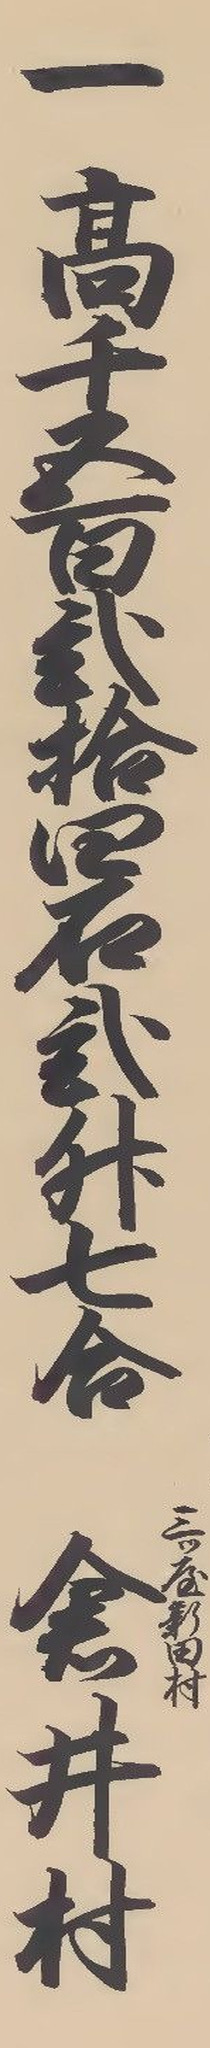一高千五百弐拾四石弐升七合倉井村
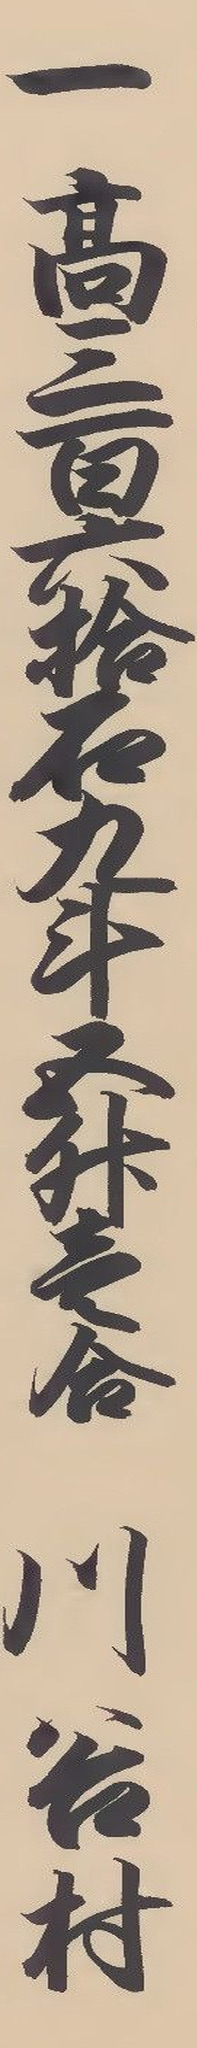一高三百六拾石九斗五升壱合川谷村
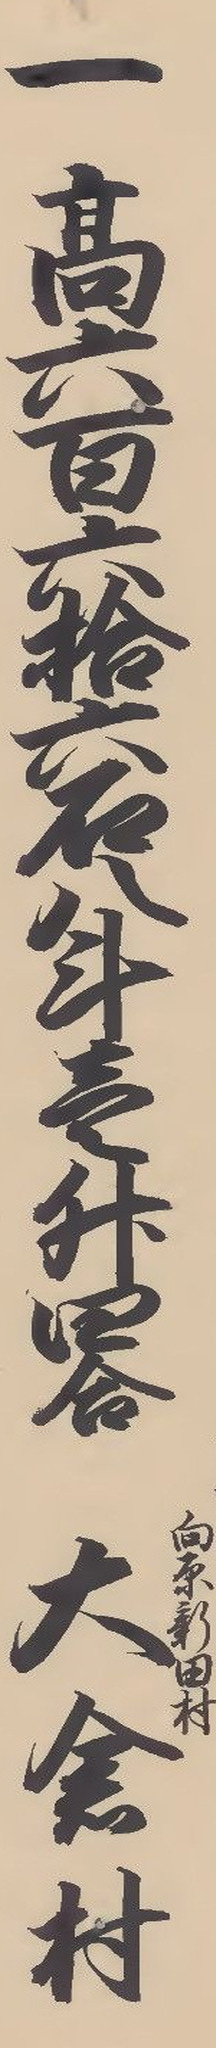一高六百六拾六石八斗壱升四合大倉村
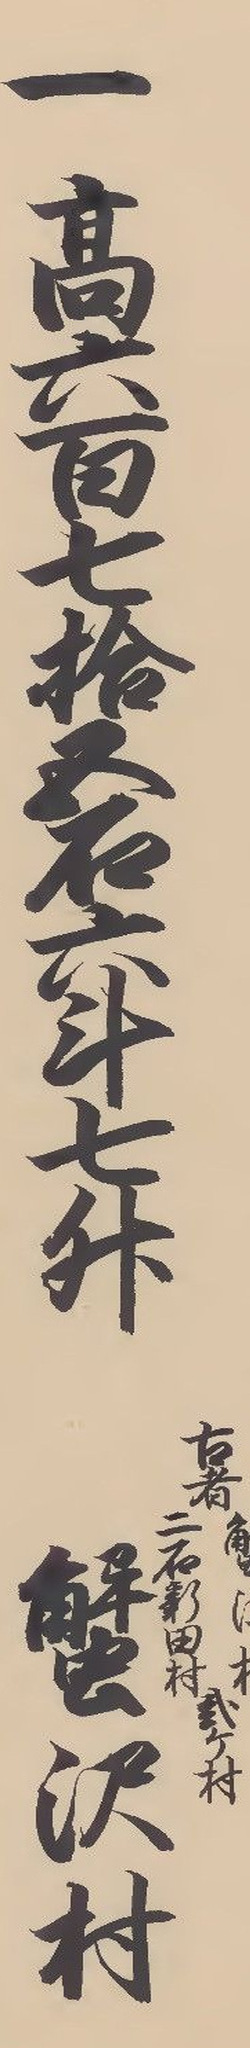一高六百七拾五石六斗七升蟹沢村
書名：信濃国郷帳
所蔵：国立公文書館 National Archives of Japan
